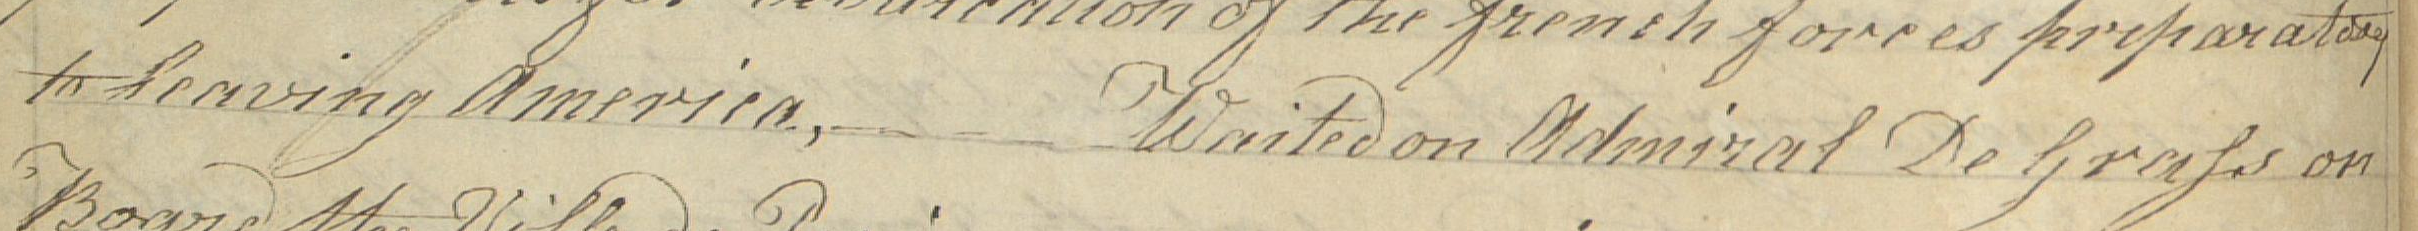to Leaving America, Waited on Admiral De Grass on
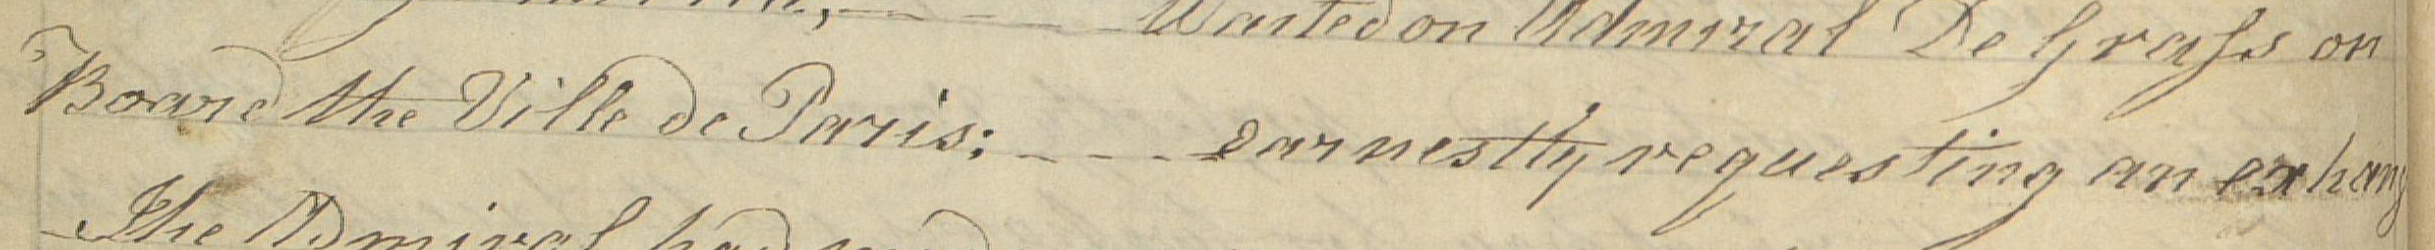Board the Ville de Paris: earnestly requesting an exhang-
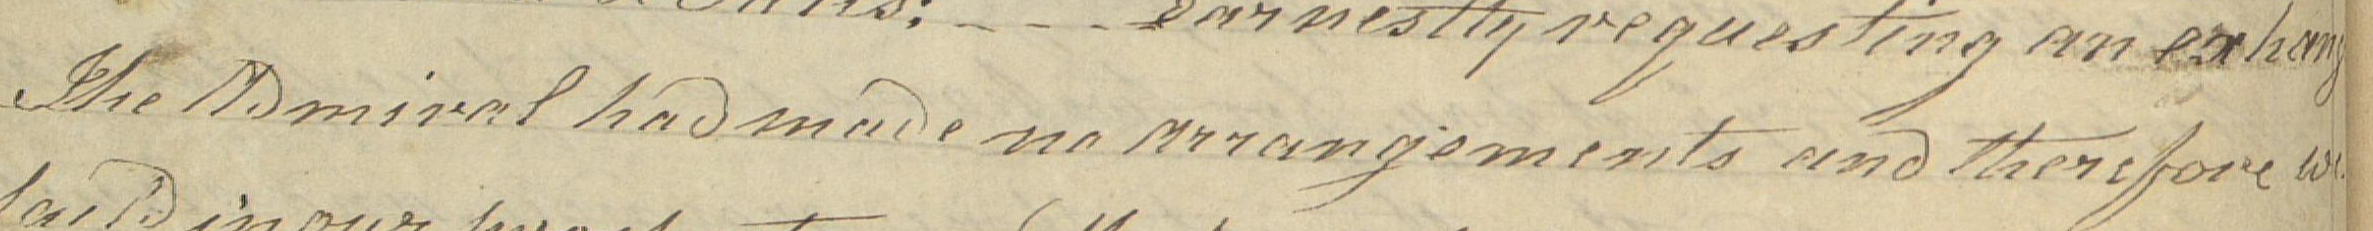The Admiral had made no arrangements and therefore w-
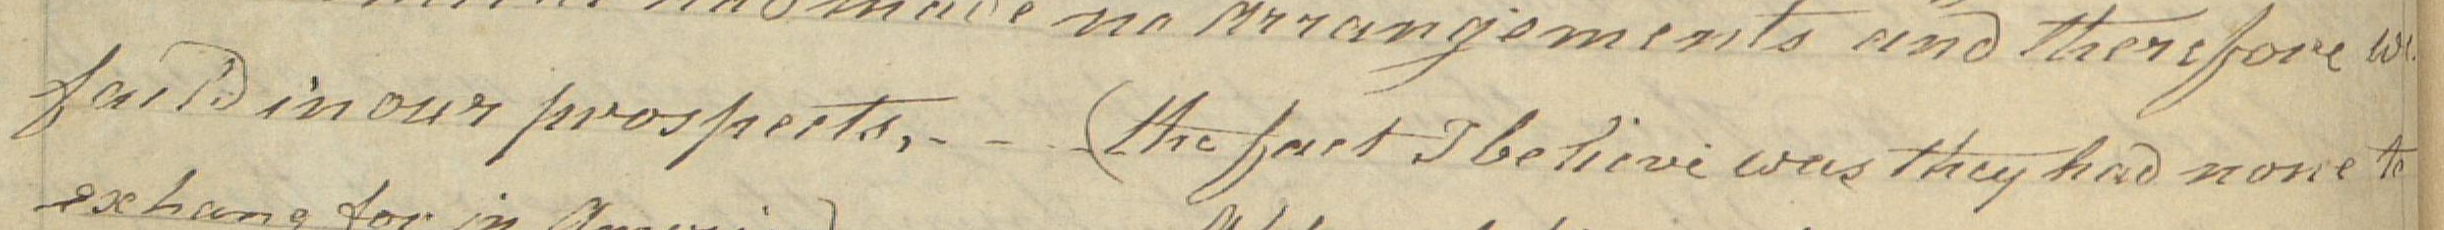faild in our prospects, (the fact I believe was they had none to
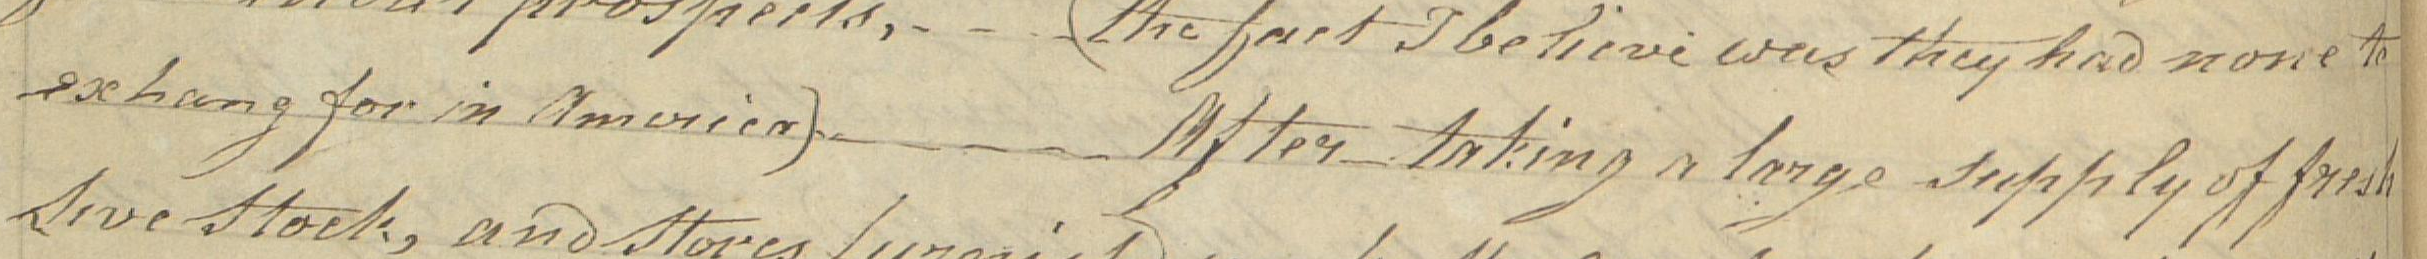exhang for in America) After taking a large supply of fresh
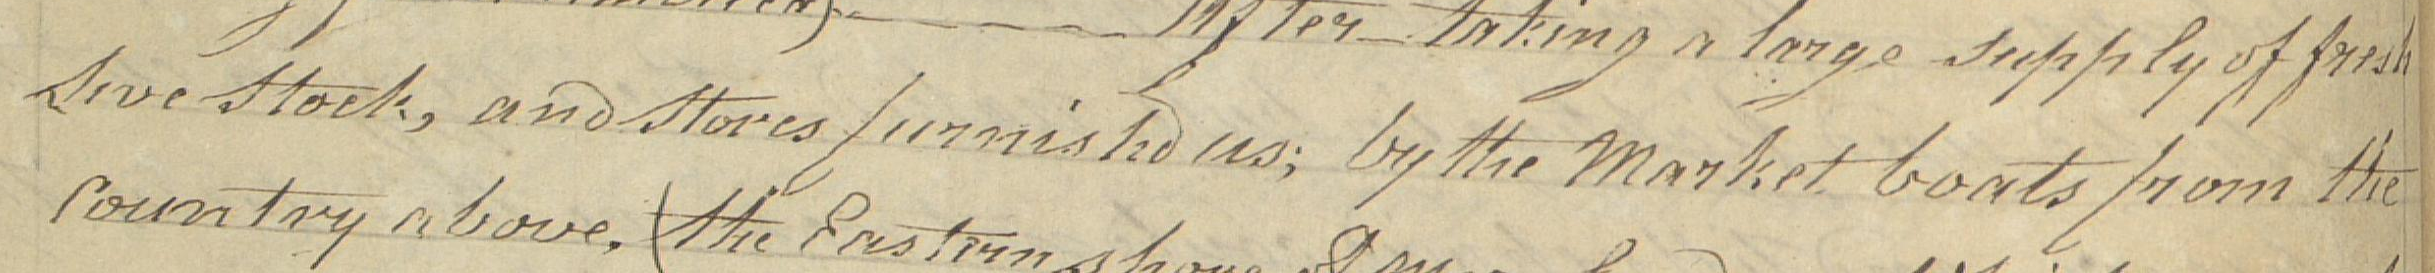Live Stock, and stores furnished us; by the market boats from the
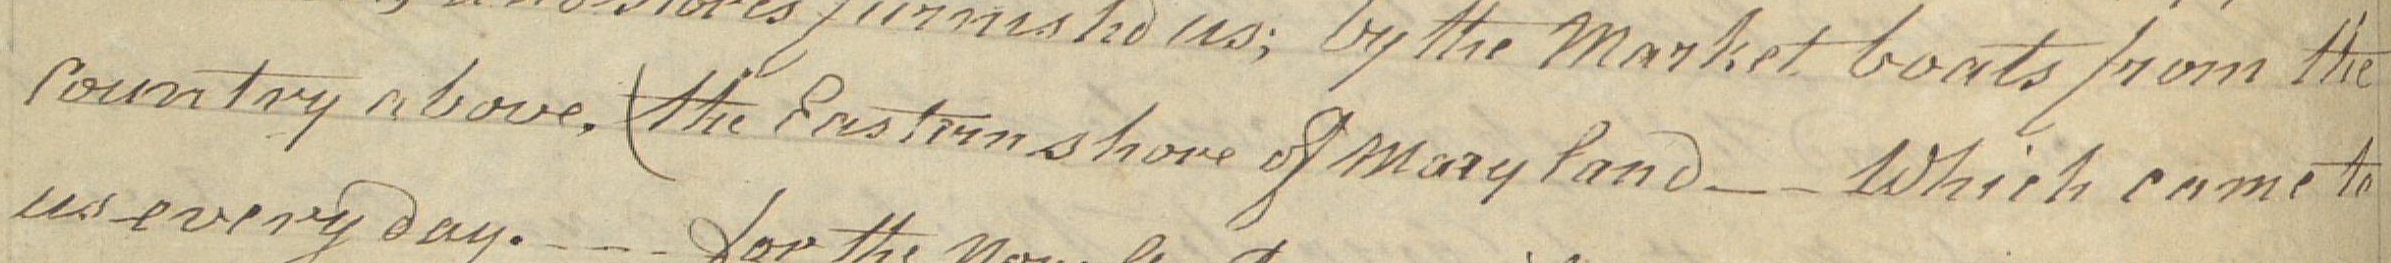Country above, (the Eastern shore of Maryland, Which came to
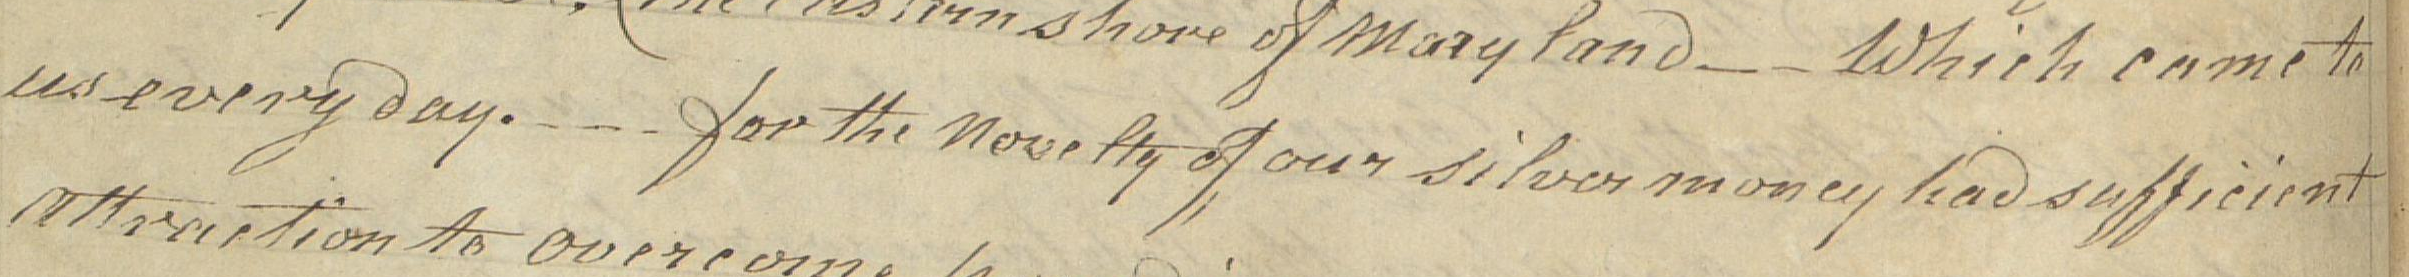us every day. for the Novelty of our silver money had sufficient
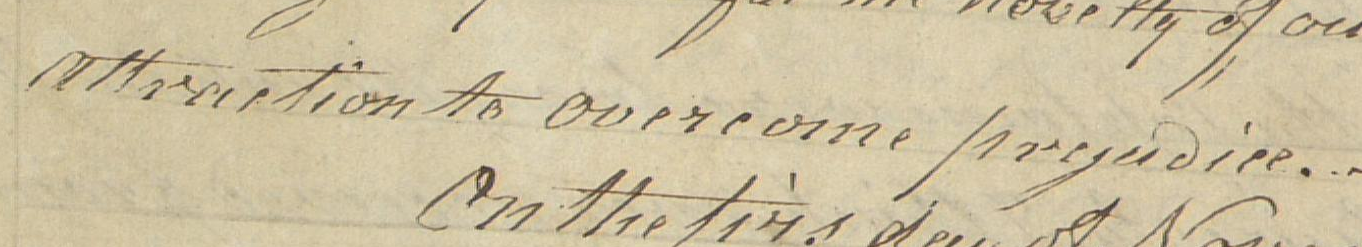Attraction to overcome prejudice.
